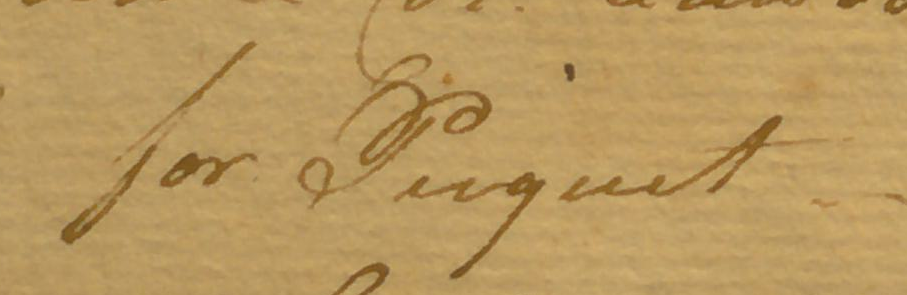for Picquet
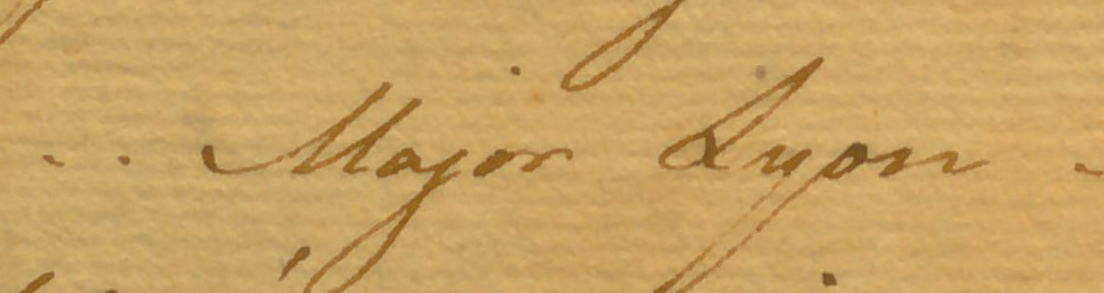.. Major Lyon
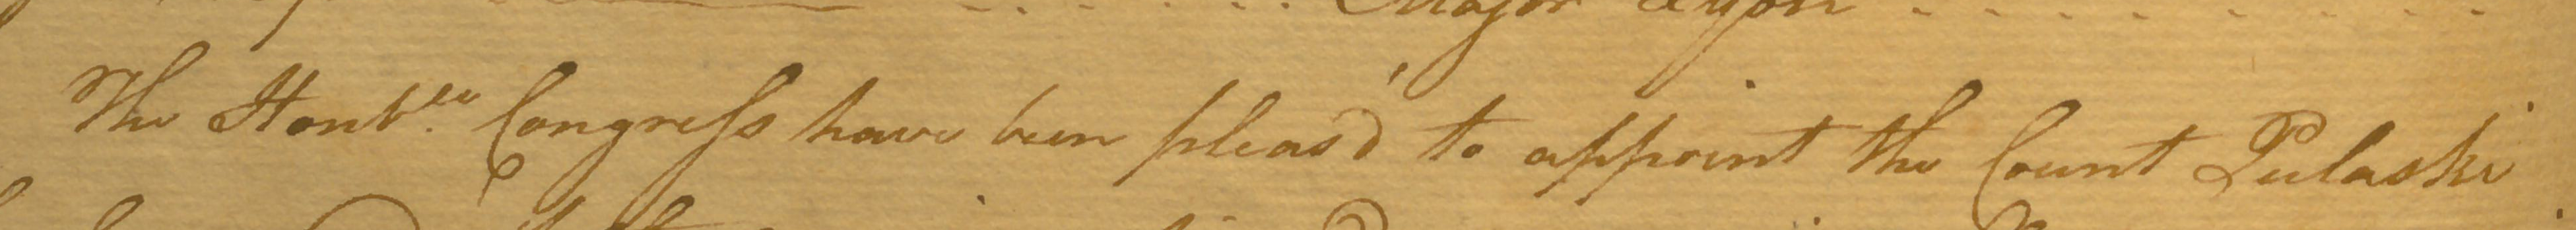The Honb^le. Congress have been pleas'd to appoint the Count Pulaski
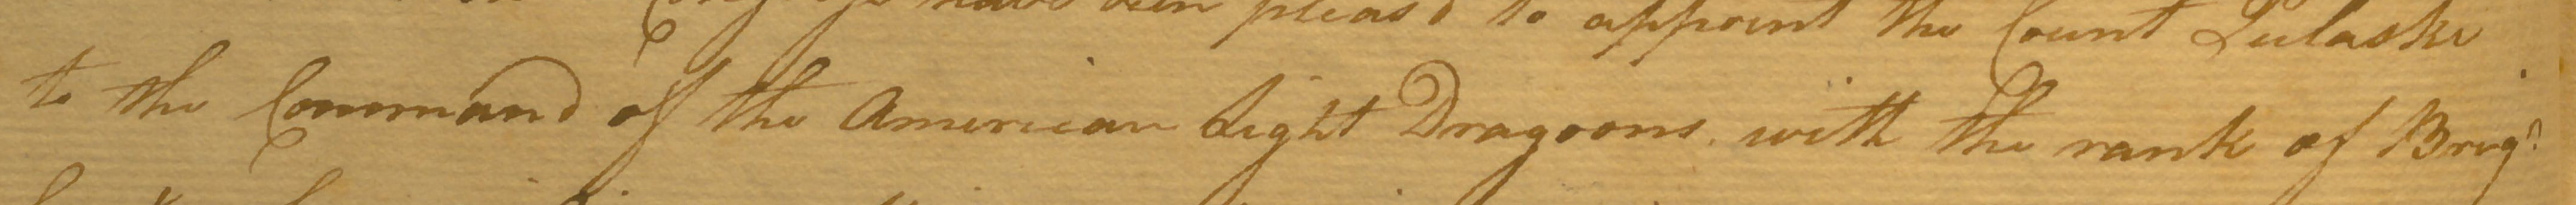to the Command of the American Light Dragoons with the rank of Brig^r.
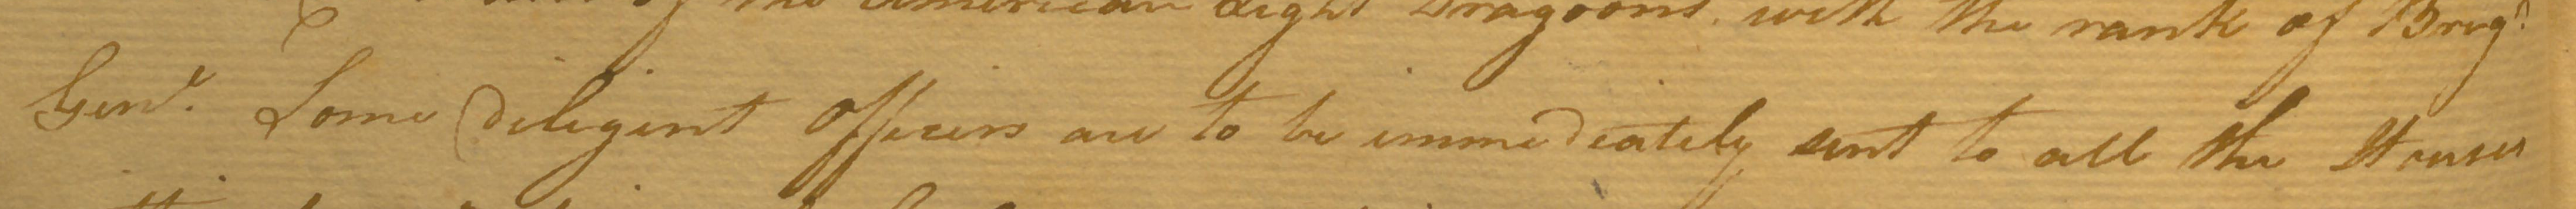Gen^l. Some diligent officers are to be immediately sent to all the Houses
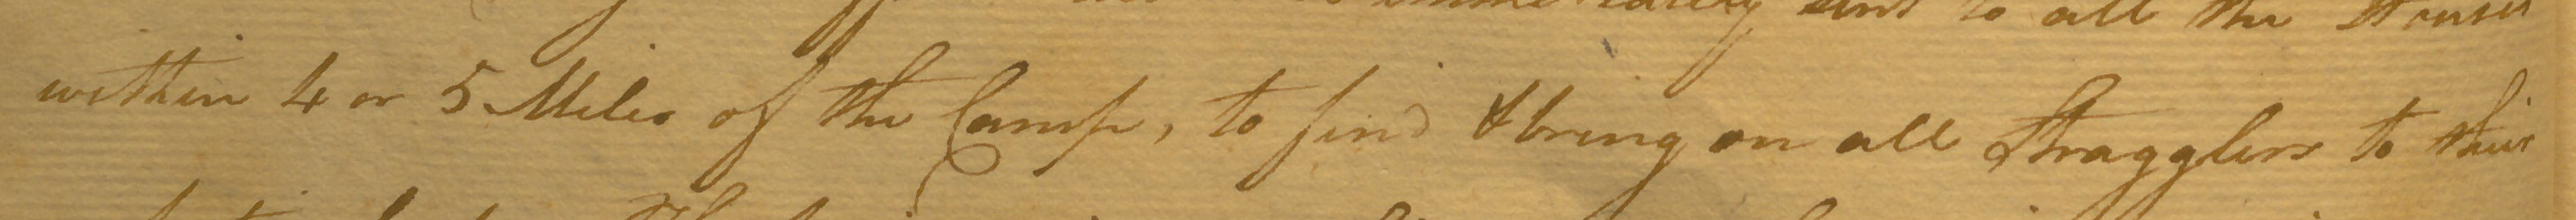within 4 or 5 Miles of the Camp, to find & bring on all Stragglers to their
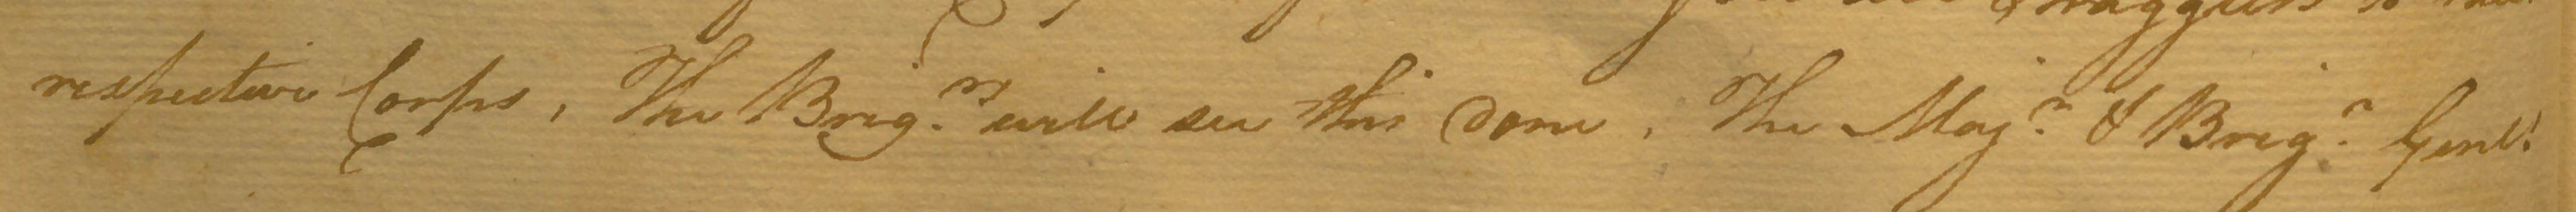respective Corps. The Brig^rs. will see this done. The Maj^r. & Brig^r. Gen^ls
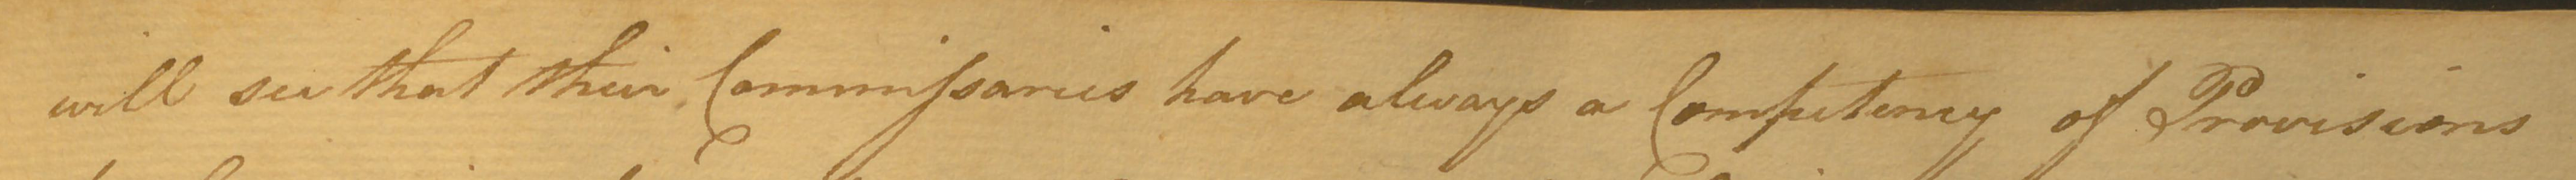will see that their Commissaries have always a Competency of Provisions
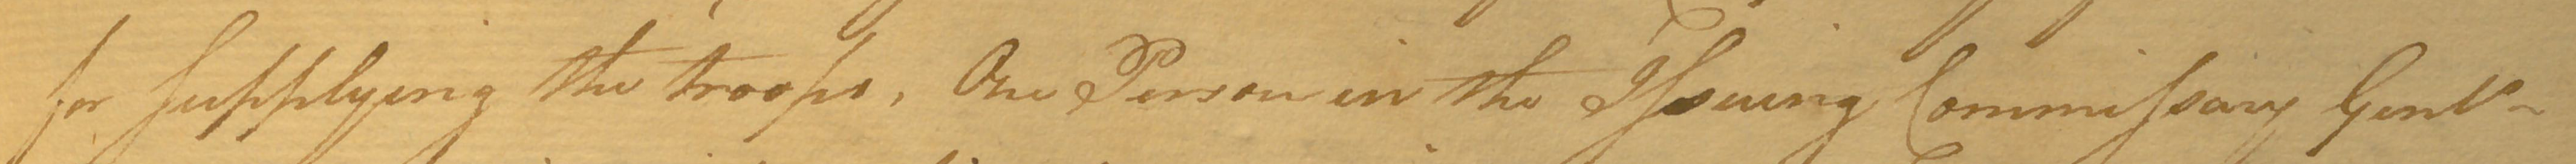for Supplying the troops. One Person in the Issuing Commissary Gen^ls
